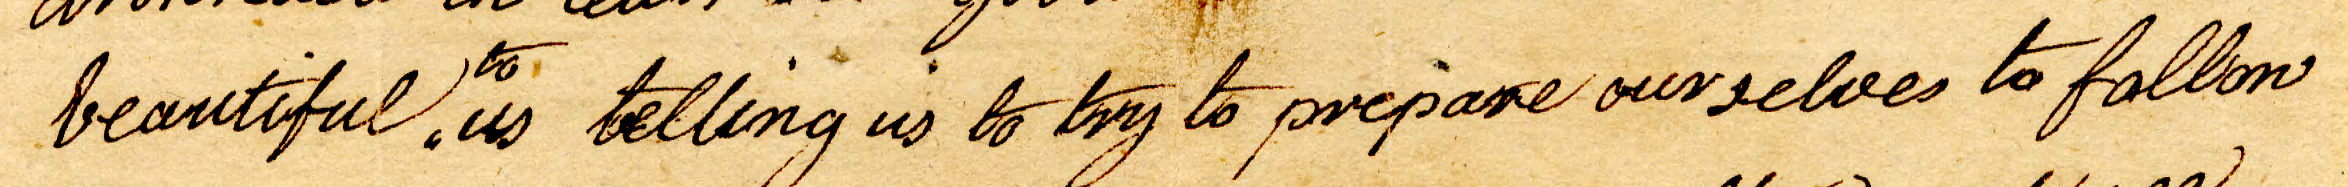beautiful ^ us telling us to try to prepare ourselves to follow
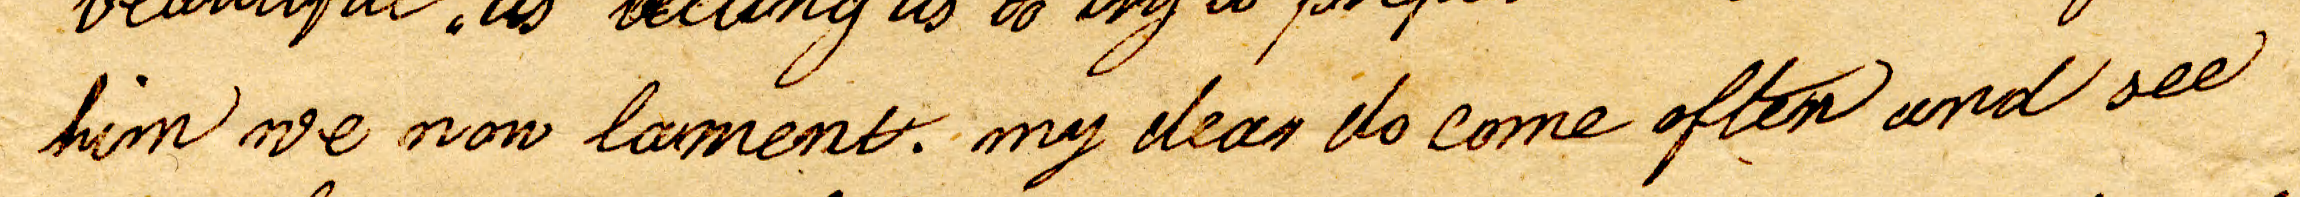him we now lament. my dear do come often and see
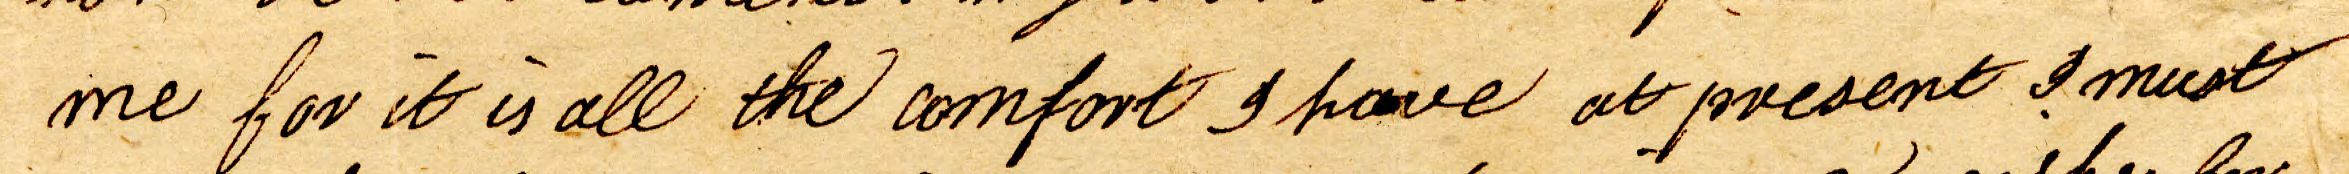me for it is all the comfort I have at present I must
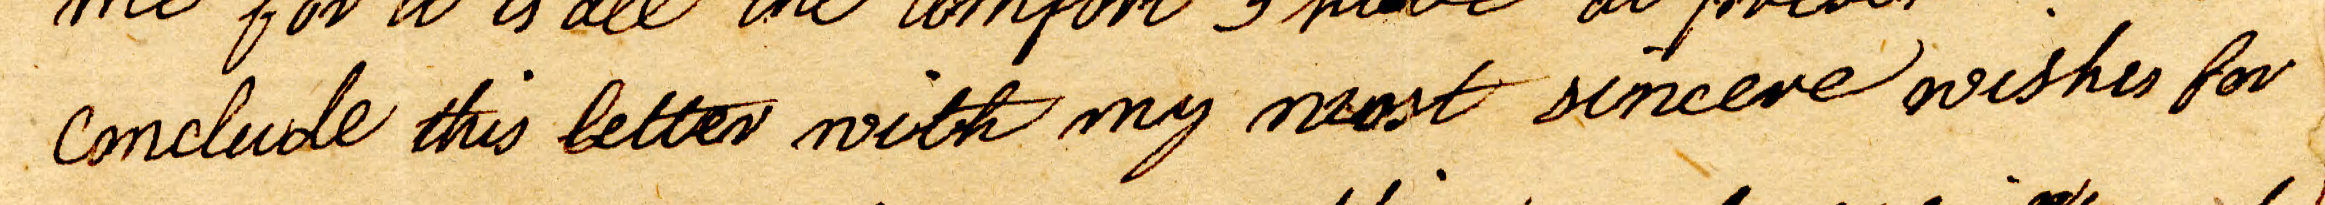conclude this letter with my most sincere wishes for
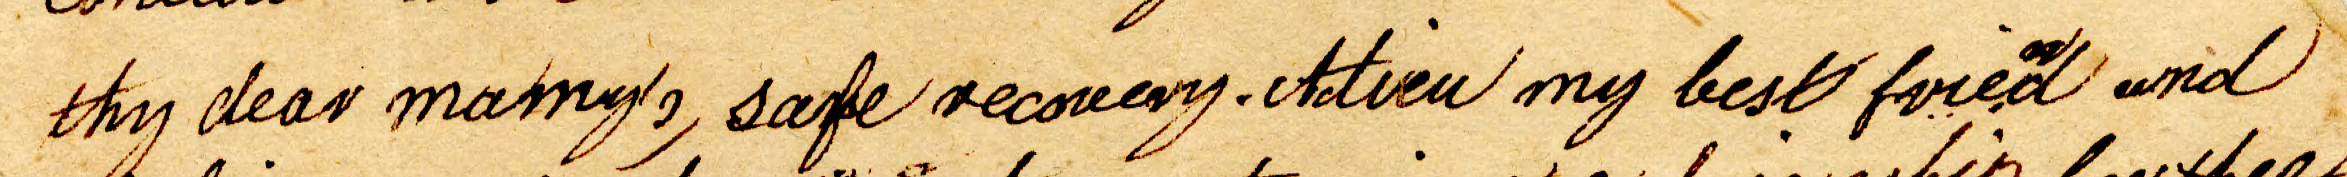thy dear mamys safe recovery. Adieu my best frie^nd and
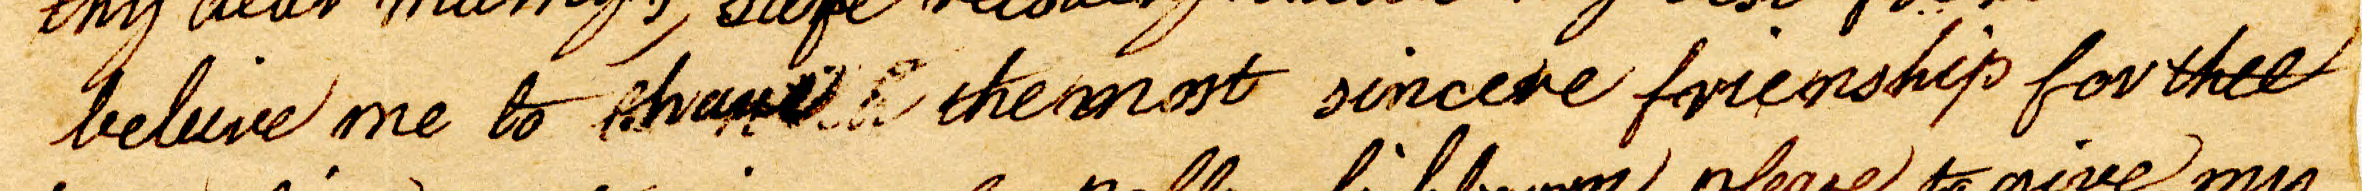believe me to show the most sincere friendship for thee
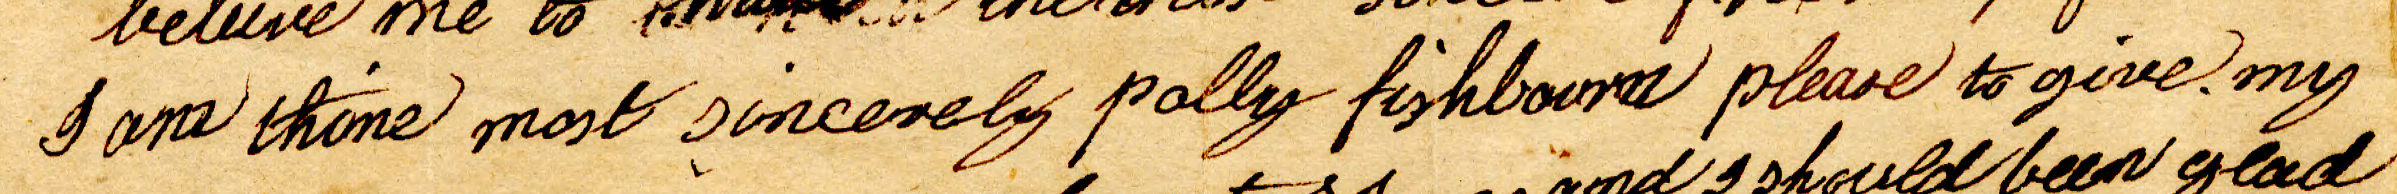I am thine most sincerely polly fishbourne please to give my
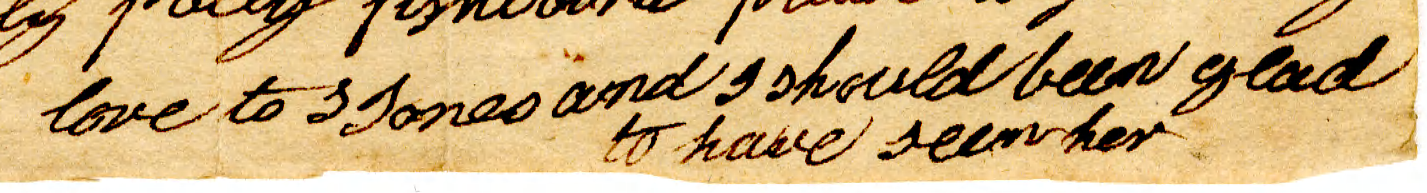love to S Jones and I should been glad
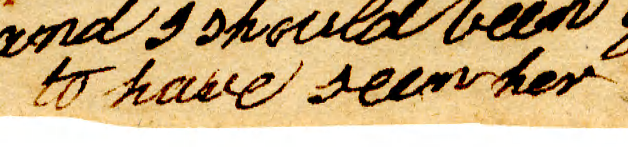to have seen her
